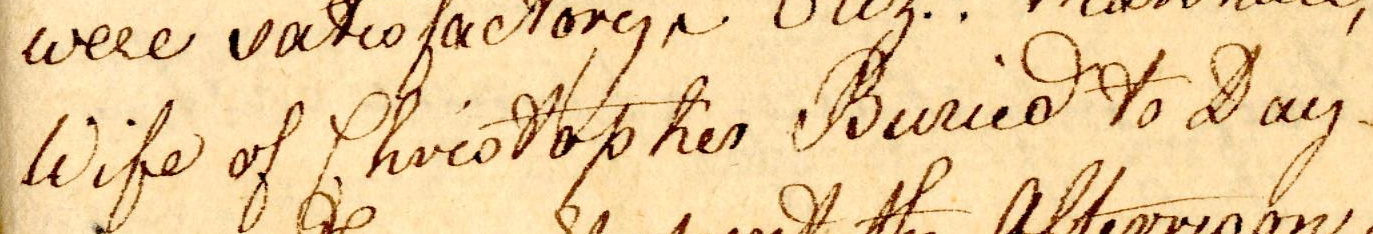Wife of Christopher Buried to Day-
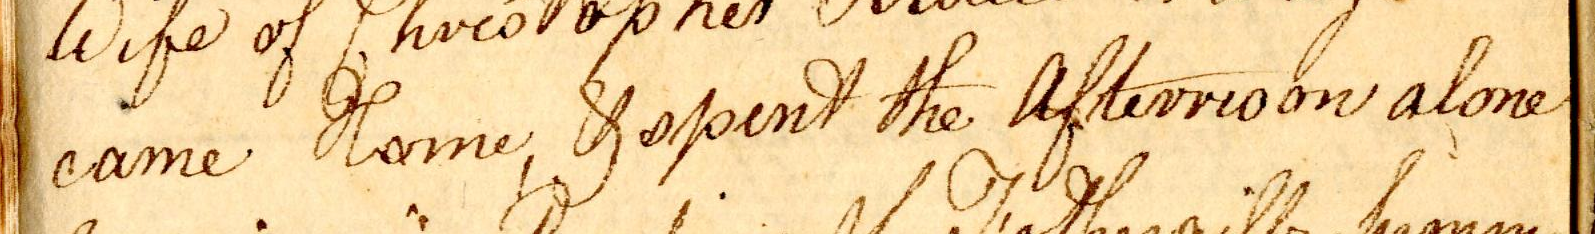came Home, & spent the Afternoon on alone
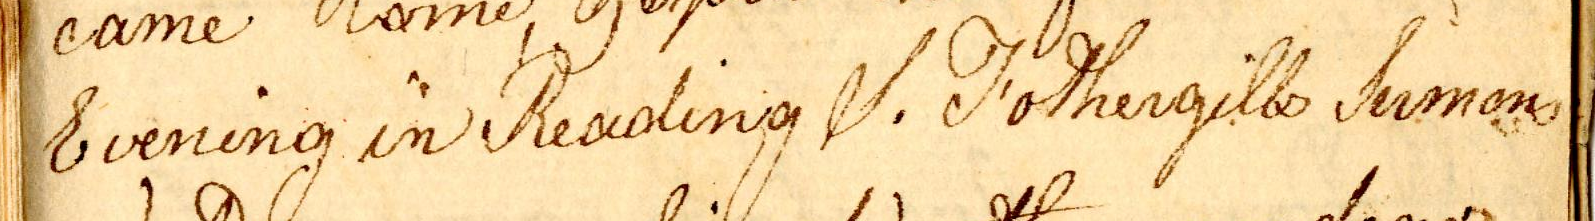Evening in Reading S. Fothergills Sermons
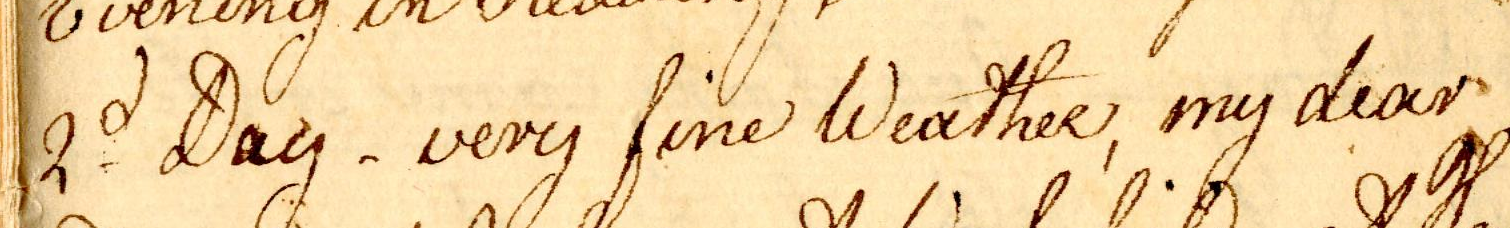2^d Day- very fine Weather, my dear
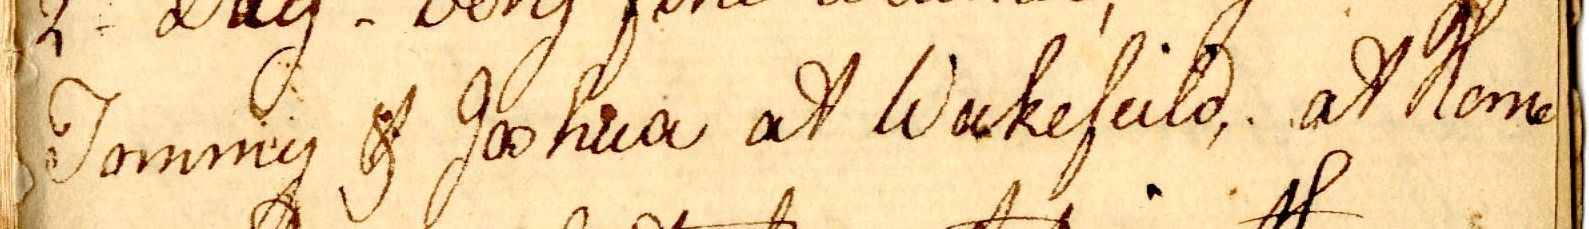Tommy & Joshua at Wakefeild, at Home
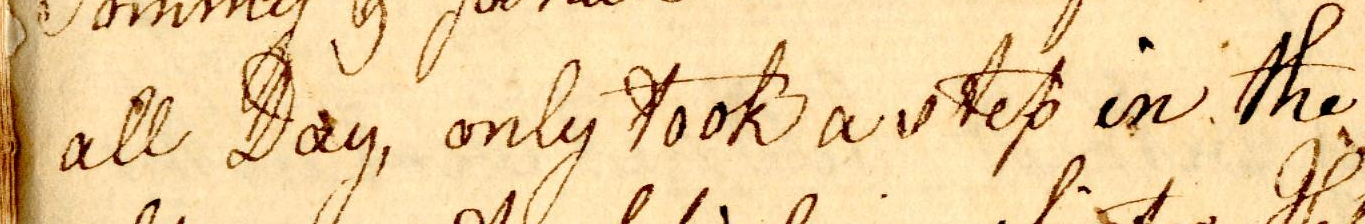all Day, only took a step in the
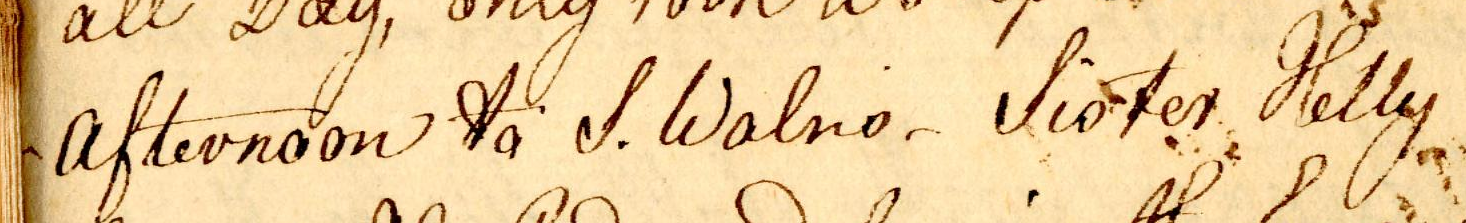Afternoon to S. Walns- Sister Hetty
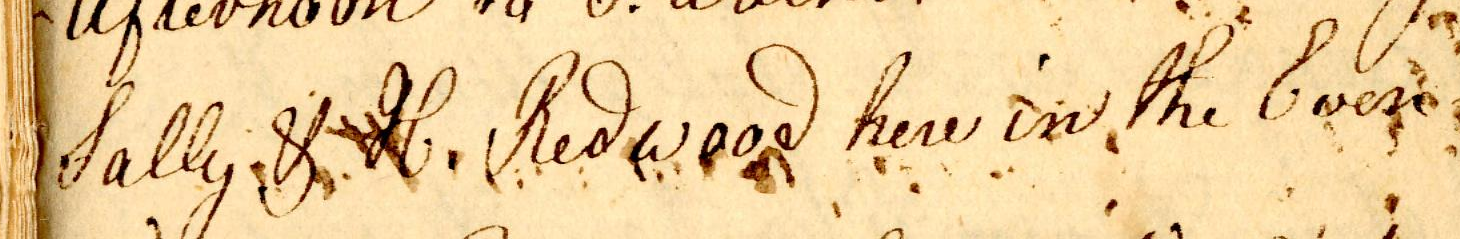Sally & H. Redwood here in the Even
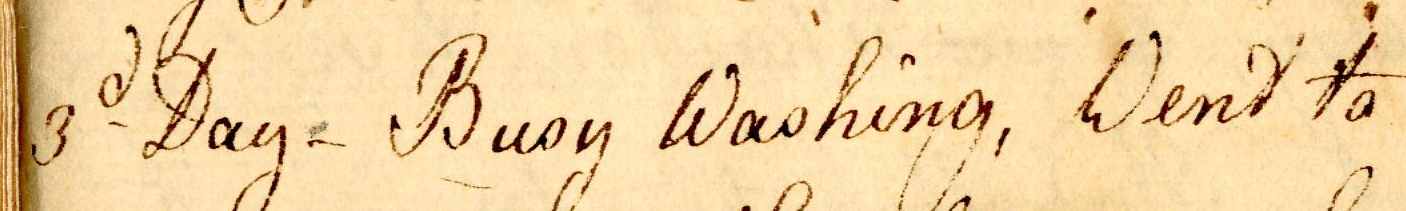3^d Day- Busy Washing, Went to
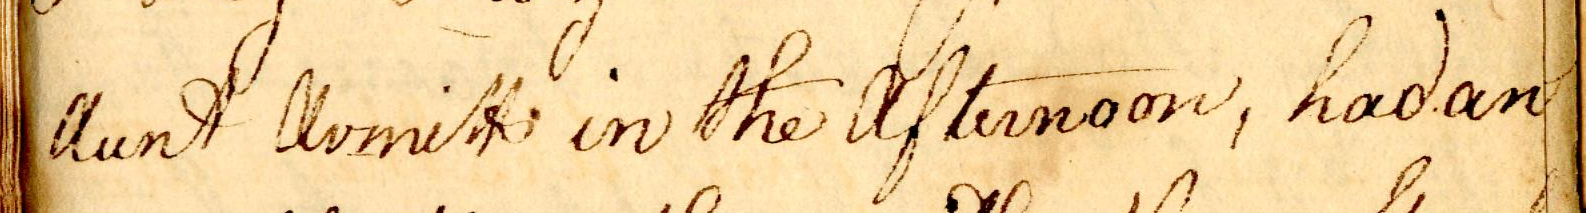Aunt Armitts in the Afternoon, had an
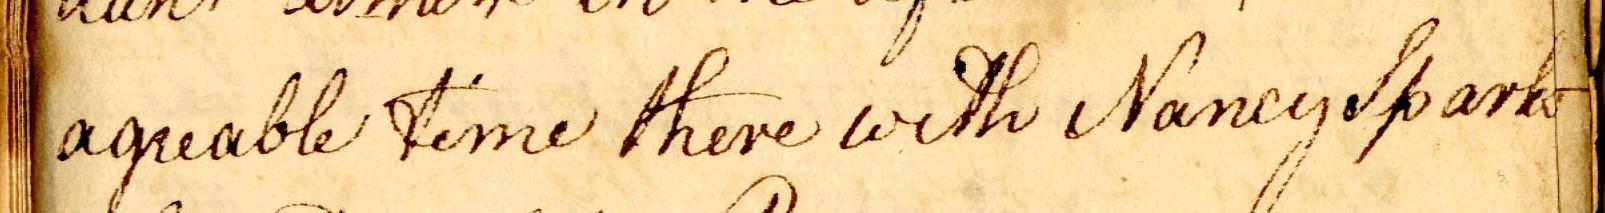agreable time there with Nancy Sparks
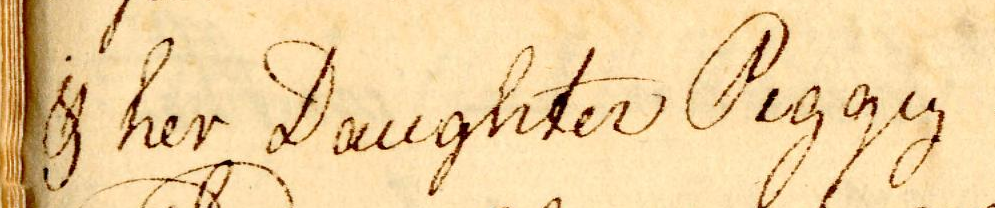& her Daughter Peggy
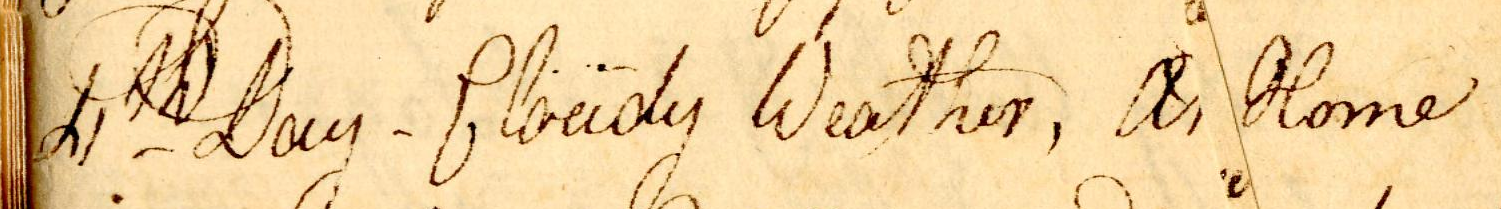4^th Day- Cloudy Weather, A Home
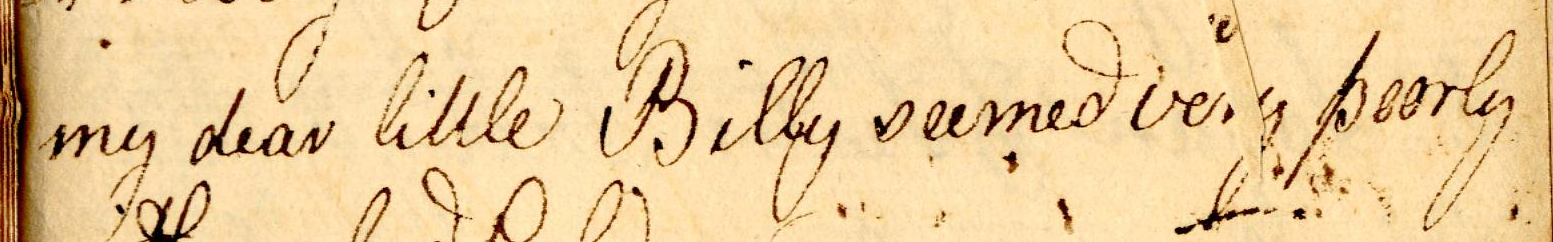my dear little Billy seemed very poorly
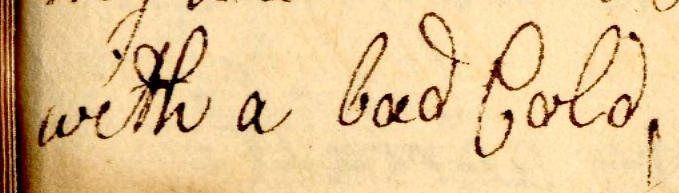with a bad Cold
